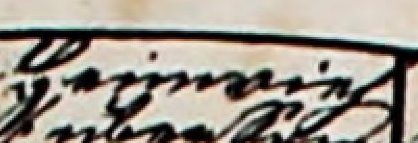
Heimvieh
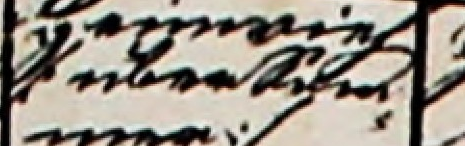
/: über Sum„
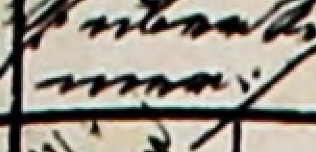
mer :/
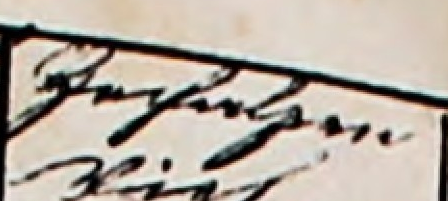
Hochatzen„
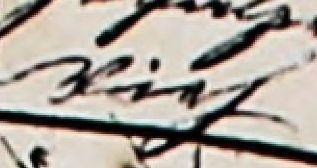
vieh
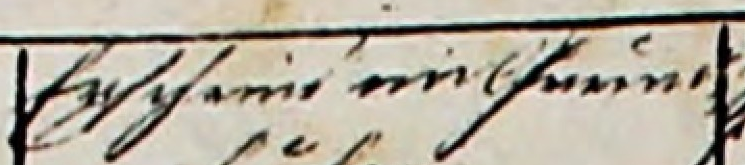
Erscheint im Grund„
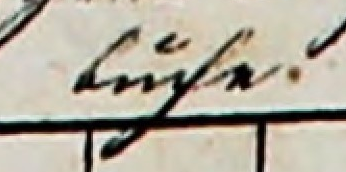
buche.
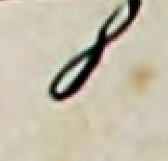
8
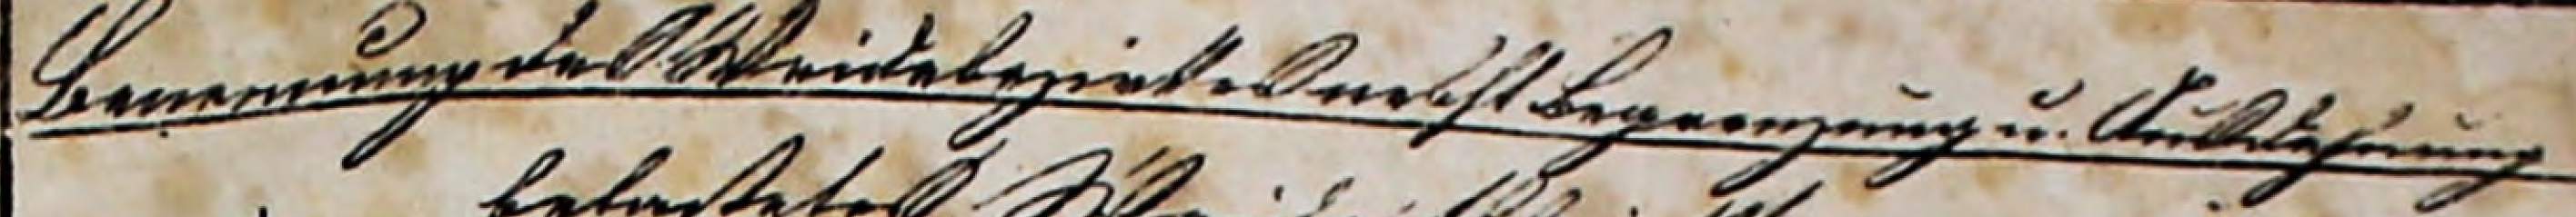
Benennung des Weidebezirkes nebst Begrenzung u. Ausdehnung
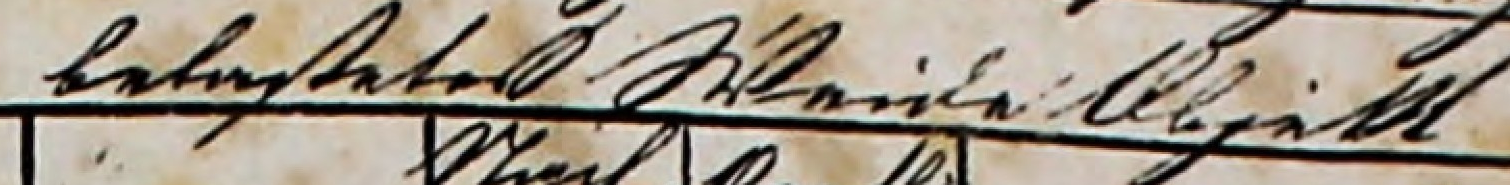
belastetes Weide Objekt
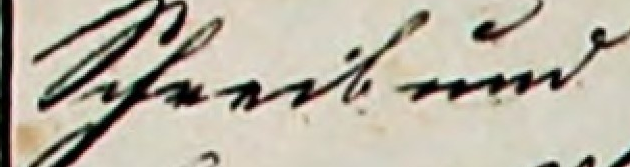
Schreib und
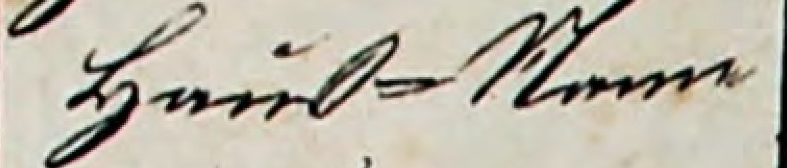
Haus = Name
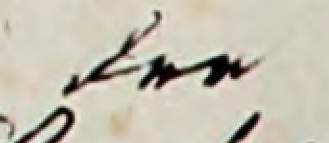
der
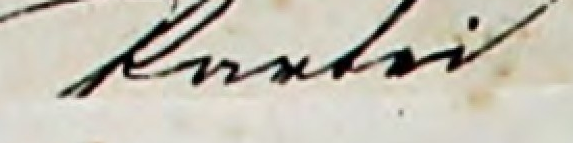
Partei
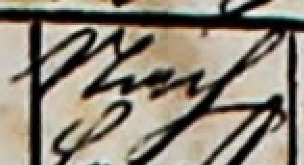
Noch
